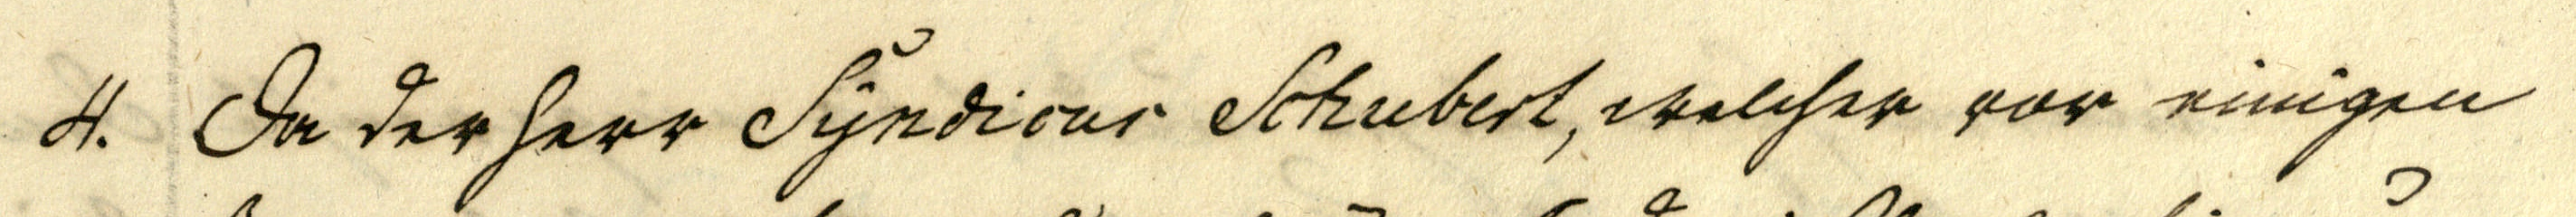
4. Da der Herr Syndicus Schubert, welcher vor einigen
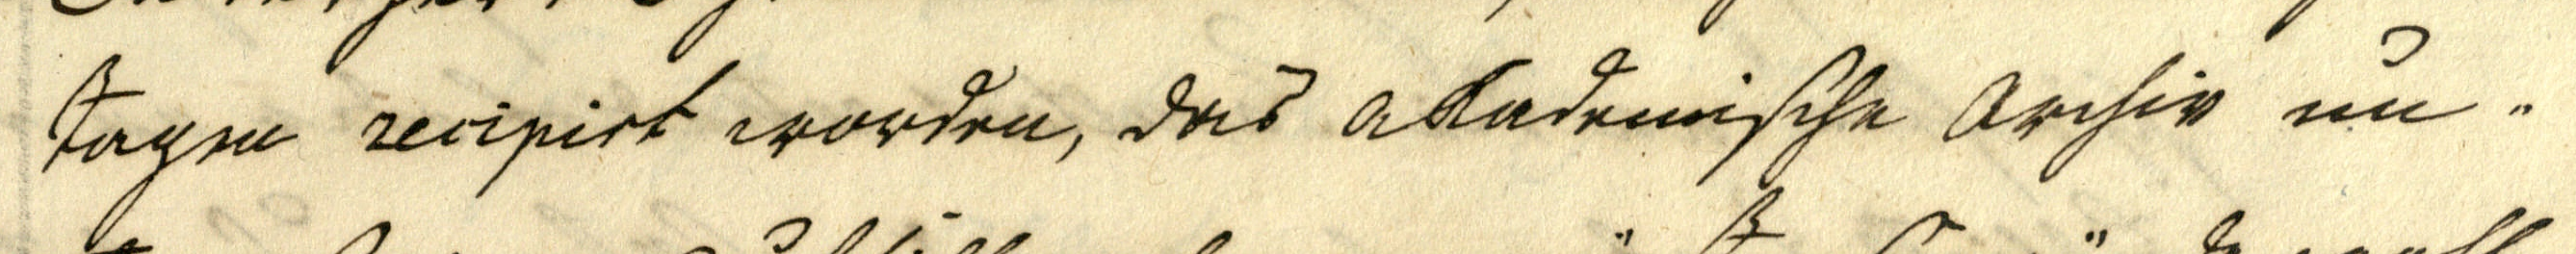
Tagen recipirt worden, das akademische Archvi un-
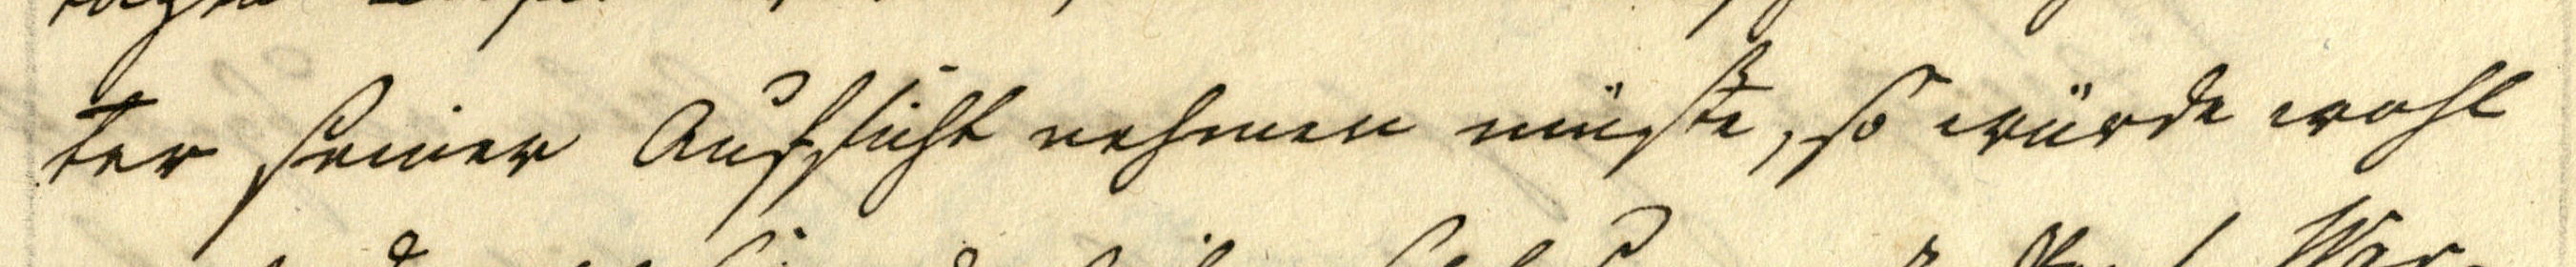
ter seiner Aufsicht nehmen müßte, so würde wohl
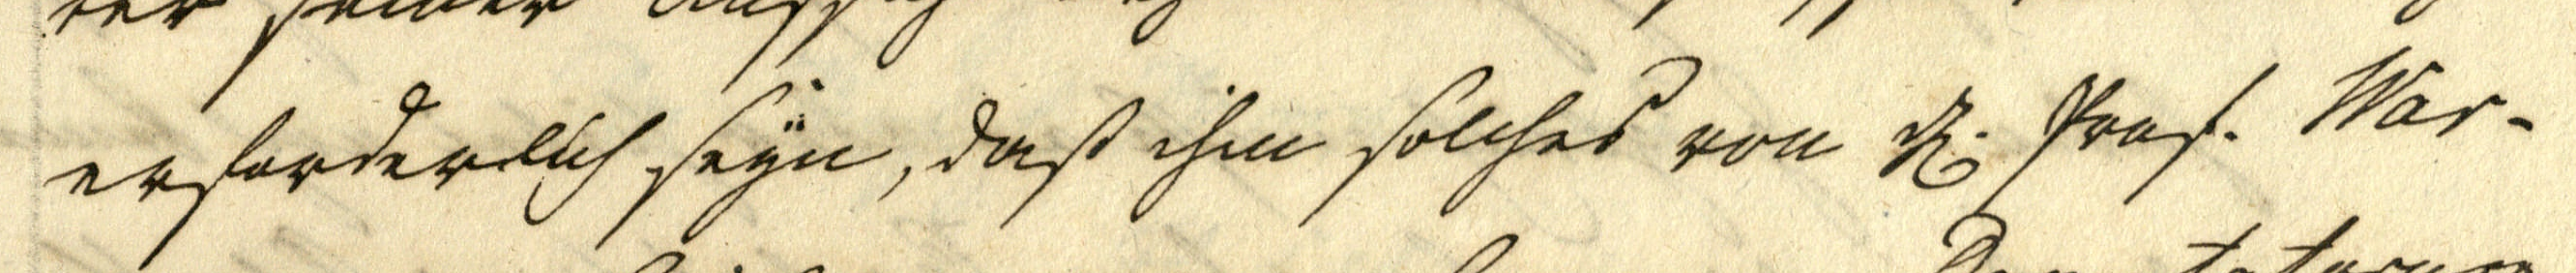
erforderlich seyn, daß ihm solches vom H. Prof. War-
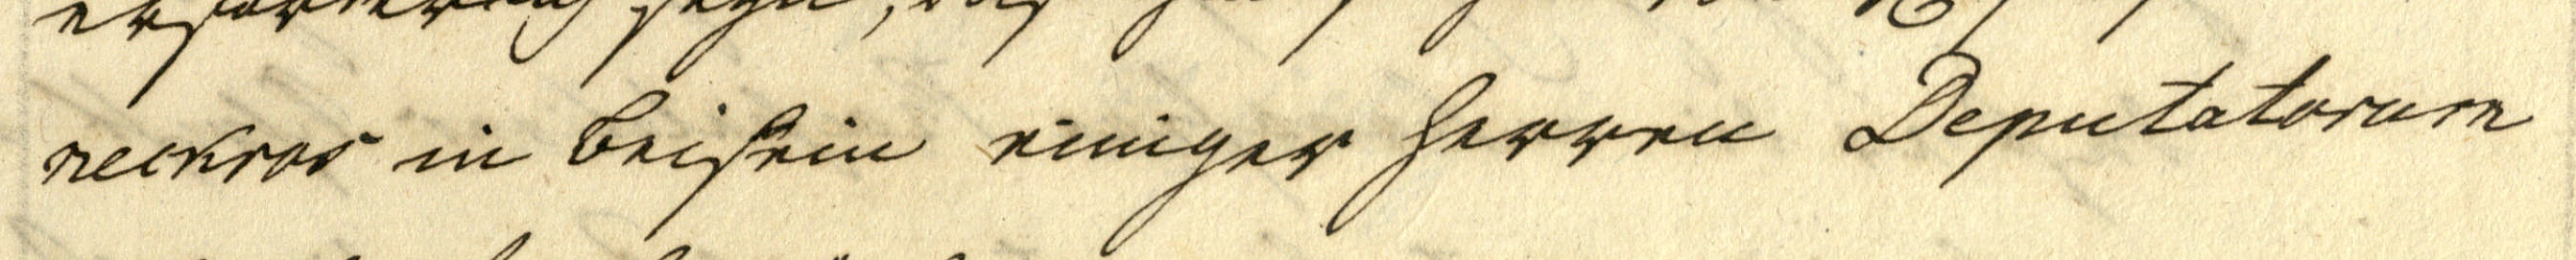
neckros im Beisein einiger Herren Deputatorum
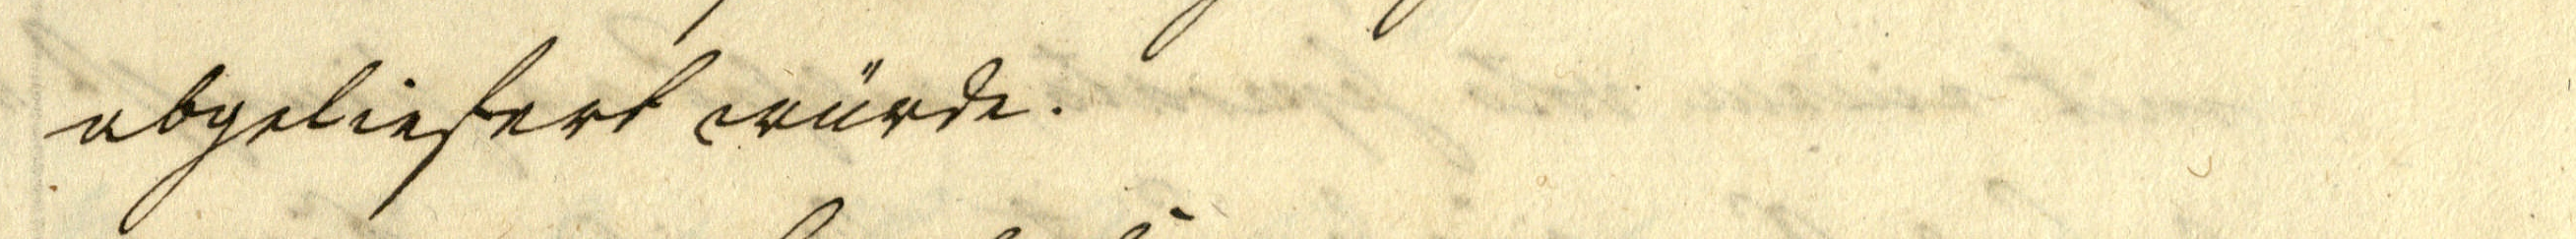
abgeliefert würde.
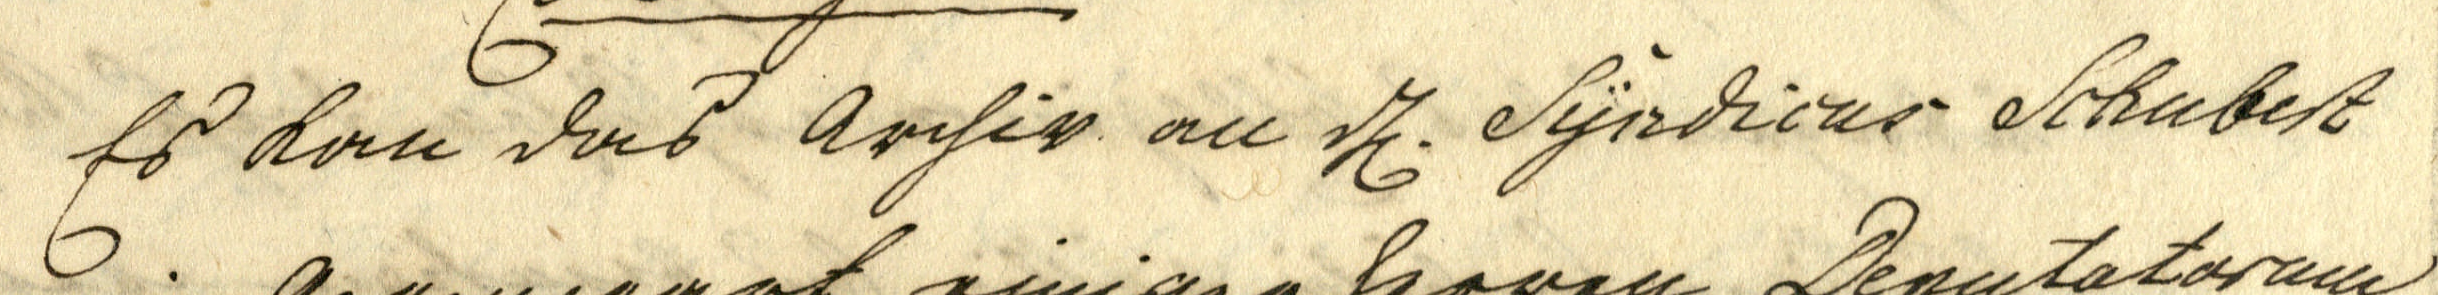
Es kan das Archiv an dh. Syndicus Schubert
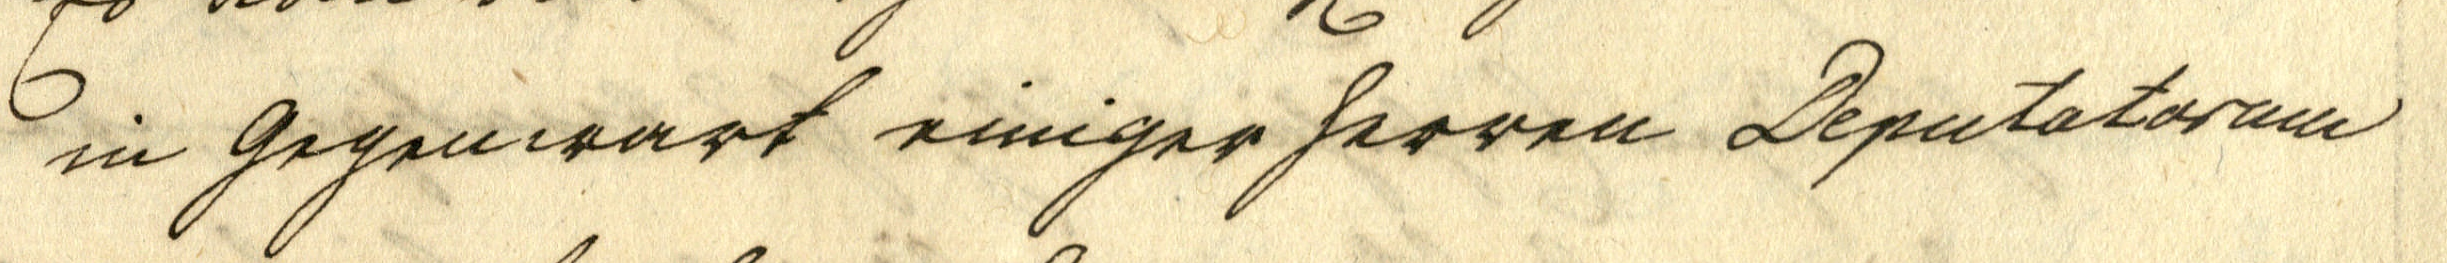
in Gegenwart einiger Herren Deputatorum
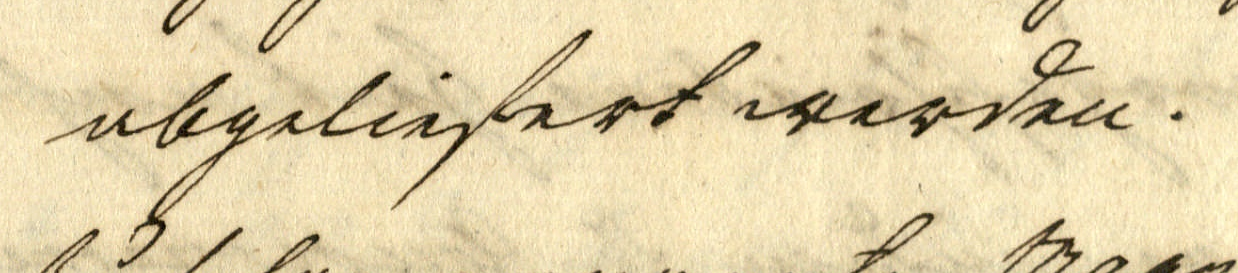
abgeliefert werden.
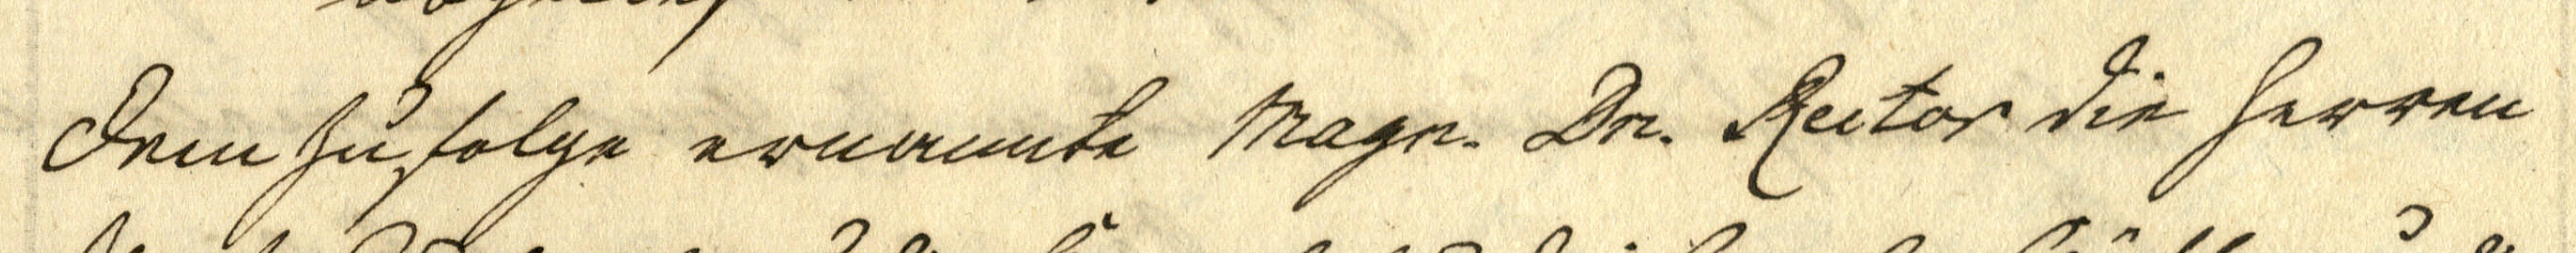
Demzufolge ernannte Magn. Dn. Rector die Herren
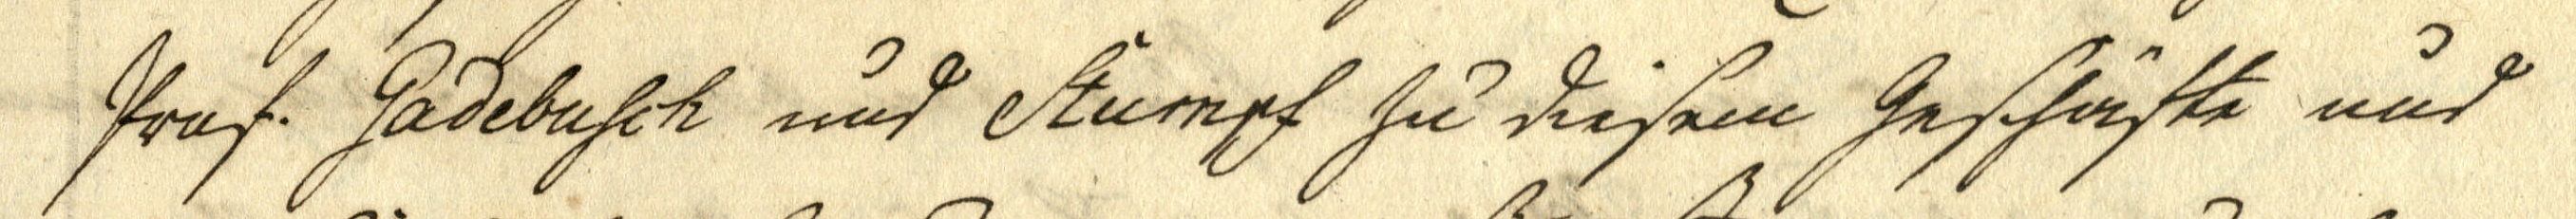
Prof. Gadebusch und Stumpf zu diesem Geschäfte und
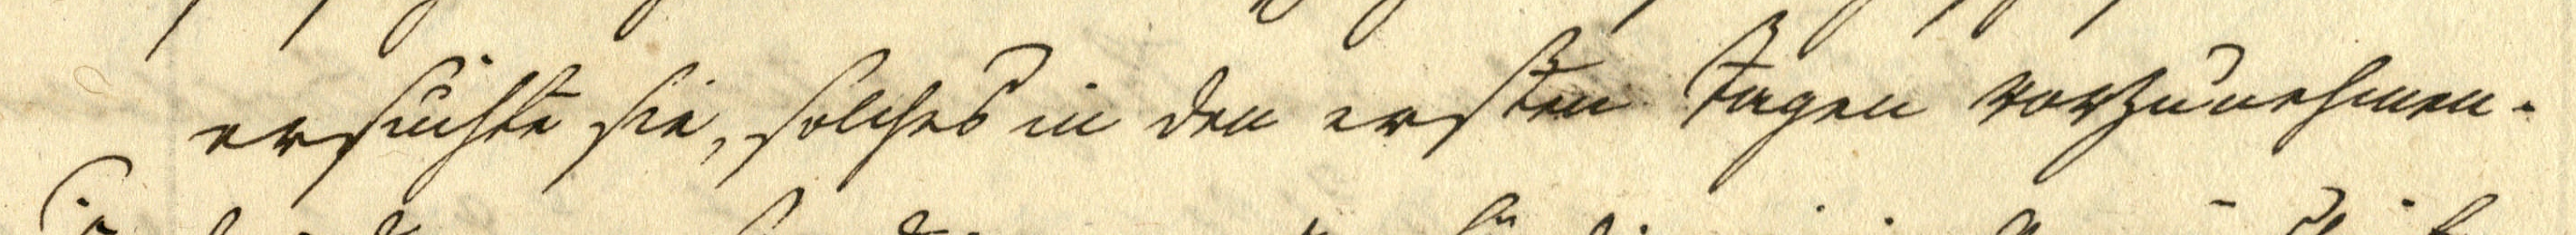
ersuchte sie, solches in den ersten Tagen vorzunehmen.
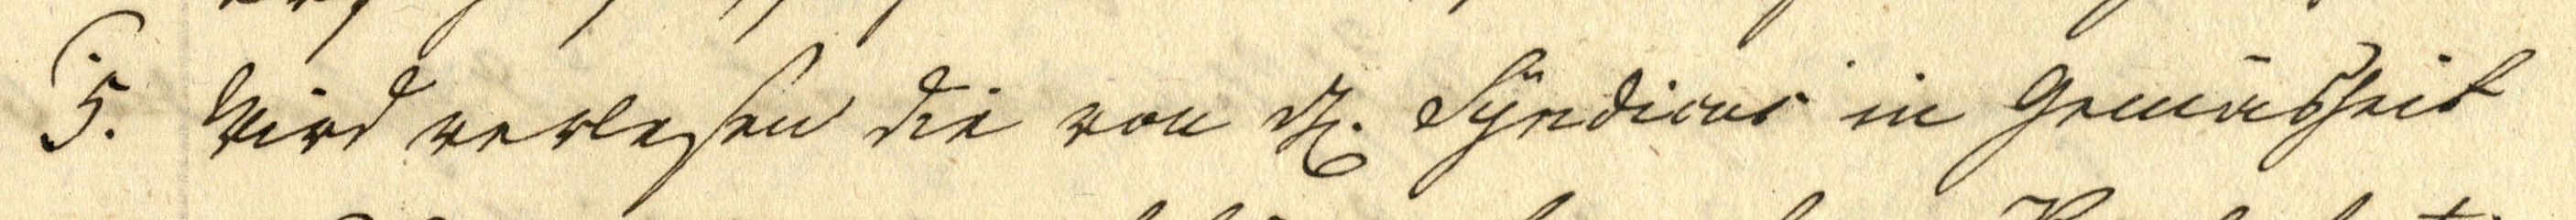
5. Wird verlesen die von dh. Syndicus in Gemäsheit
